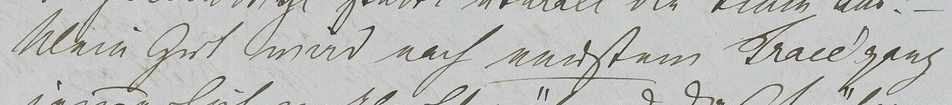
Mein Gut wird nach neustem Tracé ganz
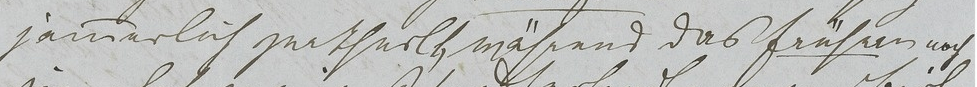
jämmerlich zertheilt, während das frühere noch
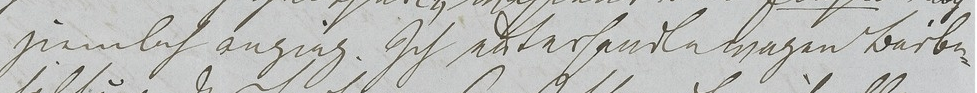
ziemlich anging. Ich unterhandle wegen Beibe-
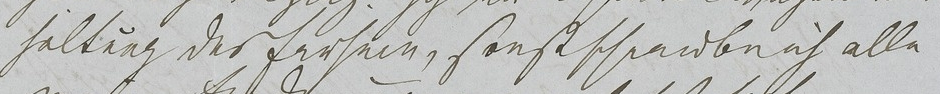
haltung des frühern, sonst schraube ich alle
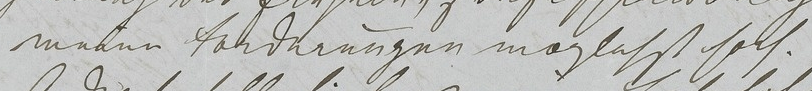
meine Forderungen möglichst hoch.
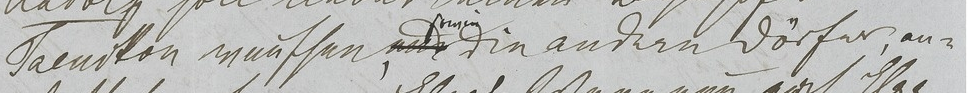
Taenikon wünschen, undsowie die andern Dörfer, an-
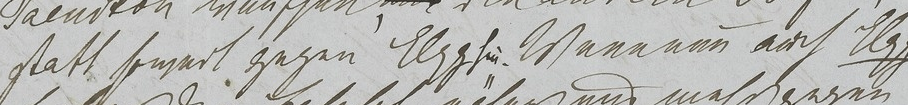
statt soweit gegen Elgg hin. Wenn nun auch Elgg
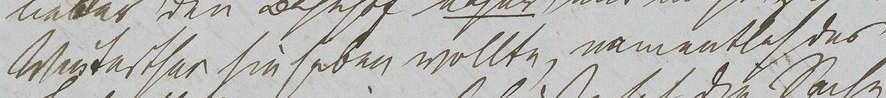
Winterthur hin haben wollte, namentlich des
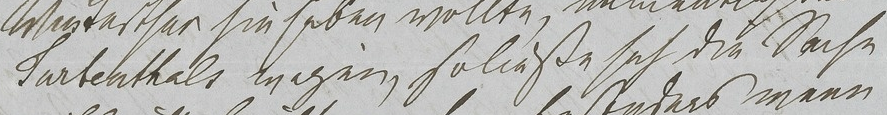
Turbenthals wegen, so ließe sich die Sache
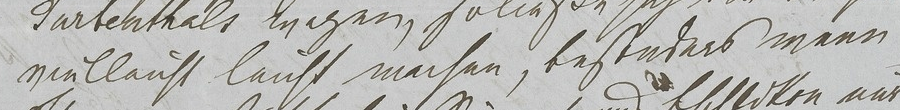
vielleicht leicht machen, besonders wenn
